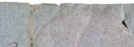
nisses bei
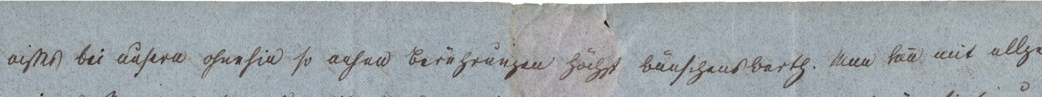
unsern ohnehin so nahen Berührungen höchst wünschenswerth.
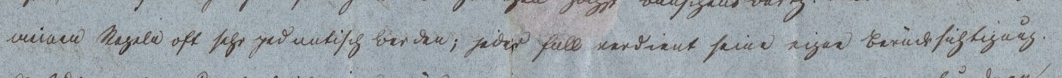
meinen Regeln oft sehr pedantisch werden; jeder Fall verdient seine eigne Berücksichtigung.
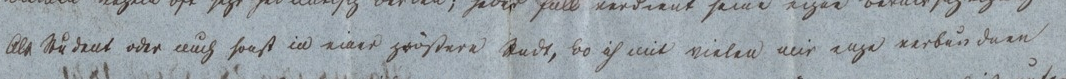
Als Student oder auch sonst in einer größern Stadt, wo ich mit vielen mir enge verbundnen
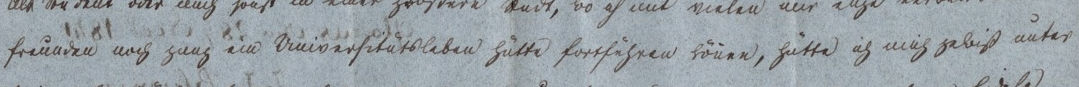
Freunden noch ganz ein Universitätsleben hätte fortführen können, hätte ich mich gewiß unter
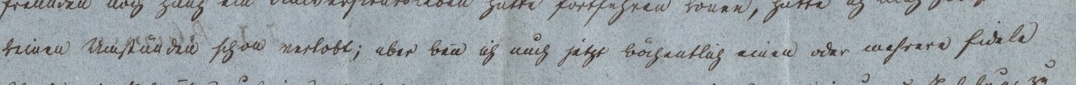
keinen Umständen schon verlobt; aber wenn ich auch jetzt wöchentlich einen oder mehrere fidele
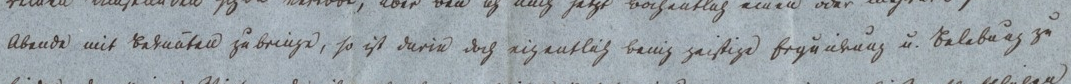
Abende mit Bekannten zubringe, so ist darin doch eigentlich wenig geistige Erquickung u. Belebung zu
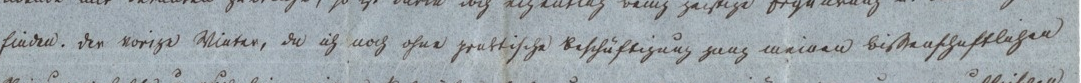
finden. Der vorige Winter, da ich noch ohne praktische Beschäftigung ganz meinen wissenschaftlichen
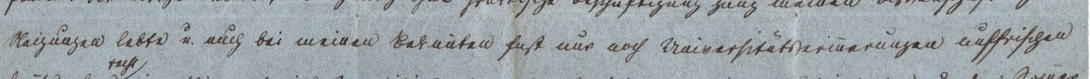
Neigungen lebte u. auch bei meinen Bekannten fast nur noch Universitätserinnerungen auffrischen
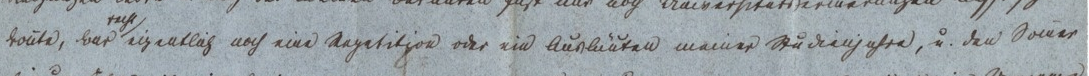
konnte, war recht eigentlich noch eine Repetition oder ein Ausläuten meiner Studienjahre, u. den Sommer
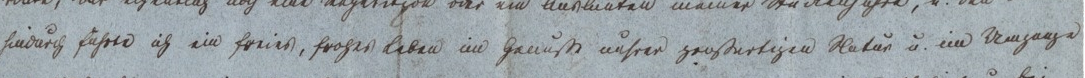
hindurch führte ich ein freies, frohes Leben im Genusse unsrer großartigen Natur u. im Umgange
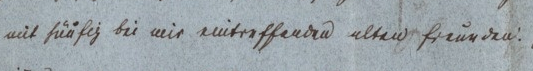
mit häufig bei mir eintreffenden alten Freunden.
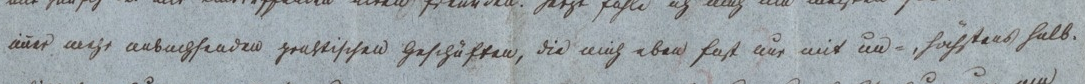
immer mehr anwachsenden praktischen Geschäften, die mich eben fast nur mit un-, höchstens halb-
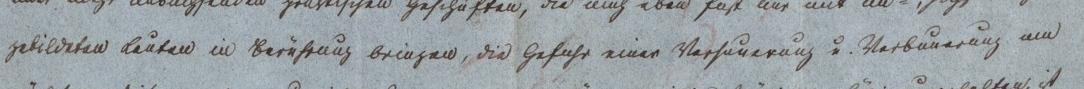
gebildeten Leuten in Berührung bringen, die Gefahr einer Versauerung u. Verbauerung am
